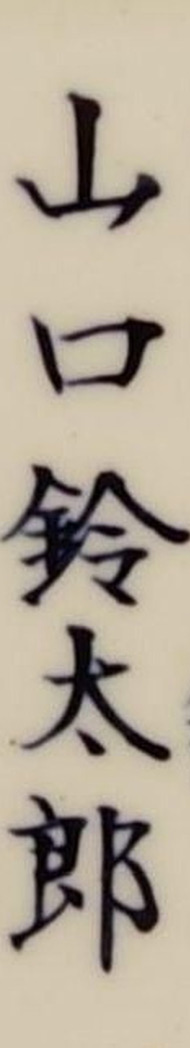山口鈴太郎
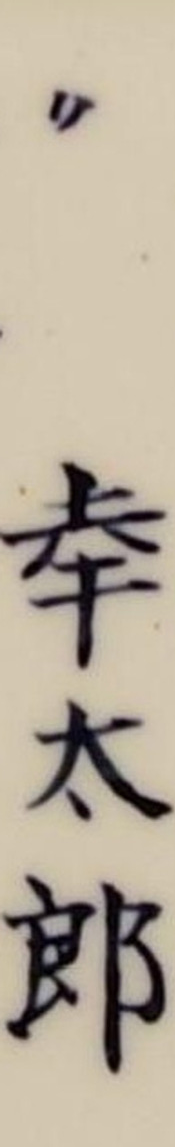幸太郎
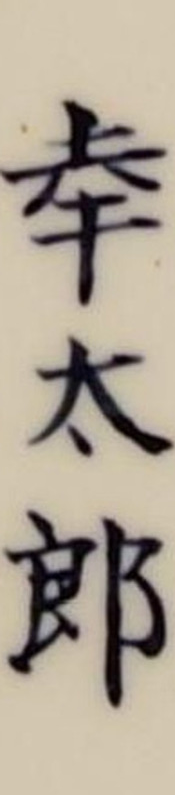幸太郎
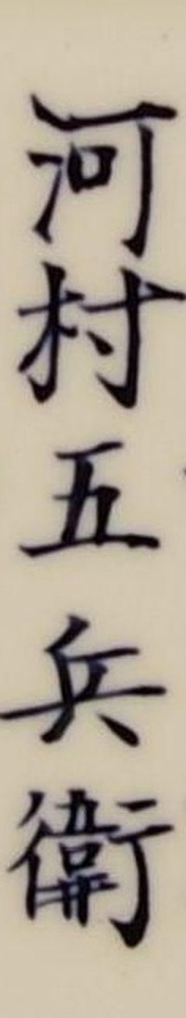河村五兵衛
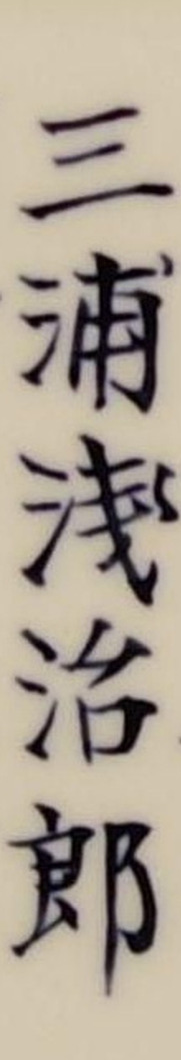三浦浅治郎
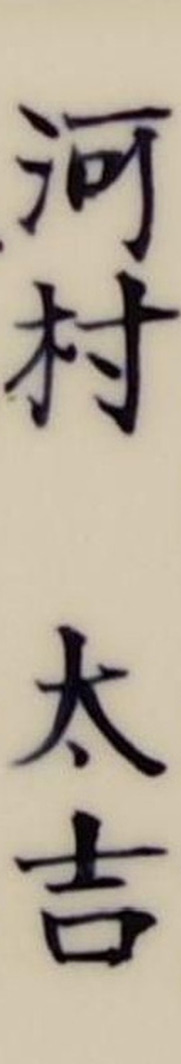河村太吉
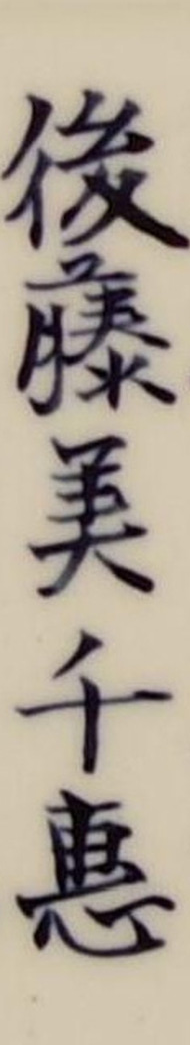後藤美千惠
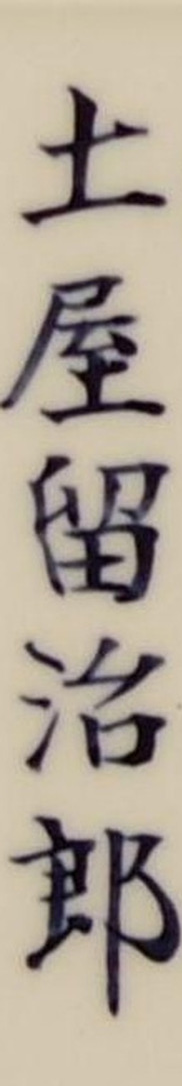土屋留治郎
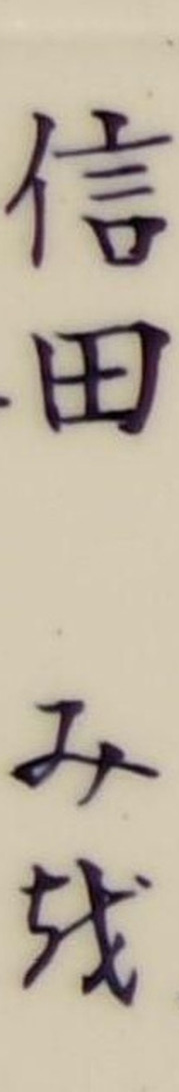信田みを
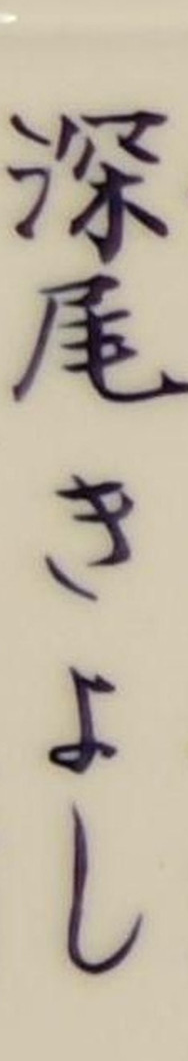深尾きよし

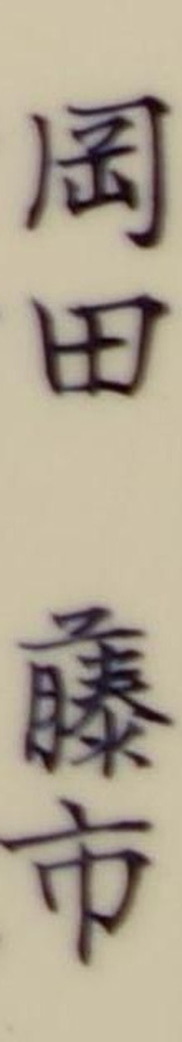岡田藤市
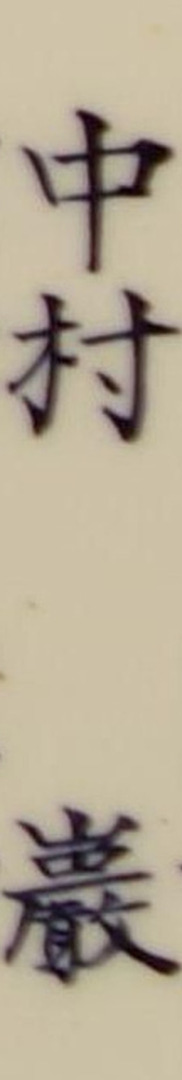中村巌
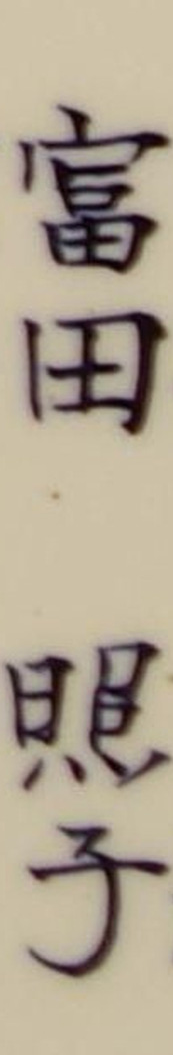富田照子
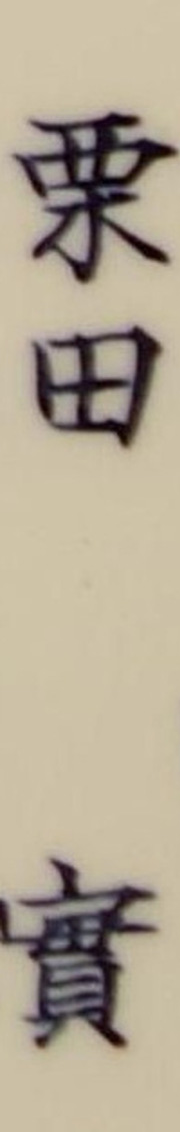栗田實
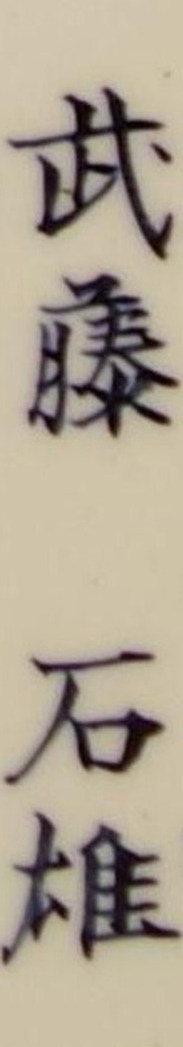武藤石雄
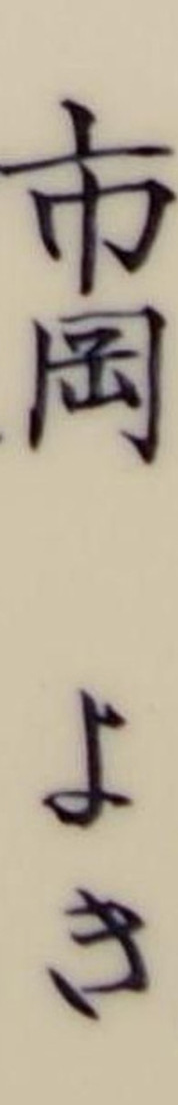市岡よき
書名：A~D
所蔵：koyasan kongobuji
